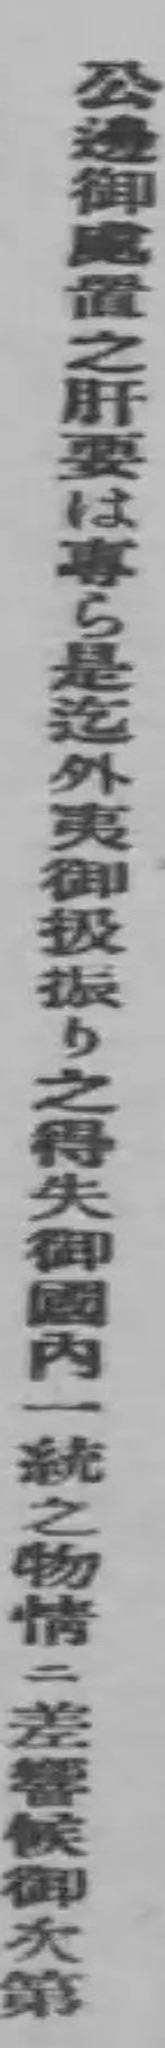公辺御処置之肝要は専ら是迄外夷御扱振り之得失御国内一統之物情ニ差響候御次第
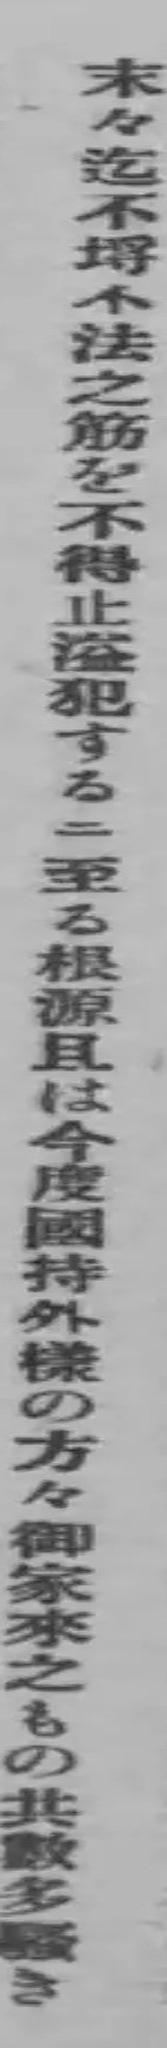末々迄不埒不法之筋を不得止溢犯するニ至る根源且は今度国持外様の方々御家来之もの共数多騒き
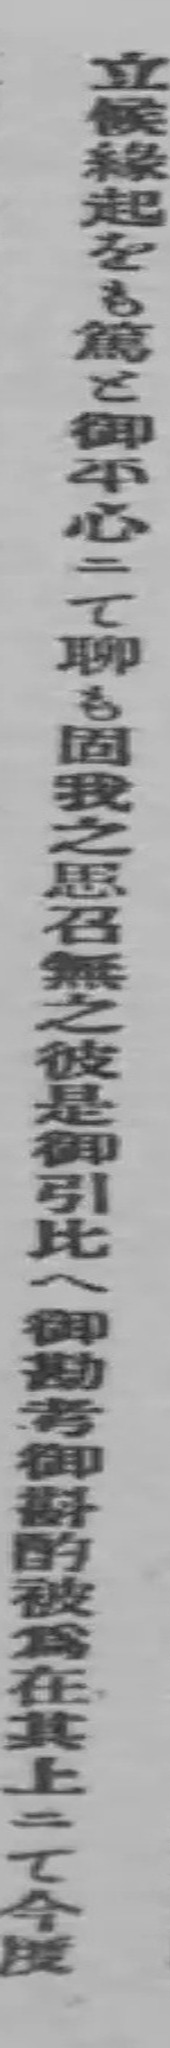立候縁起をも篤と御平心ニて聊も固我之思召無之彼是御引比へ御勘考御斟酌被為在其上ニて今度
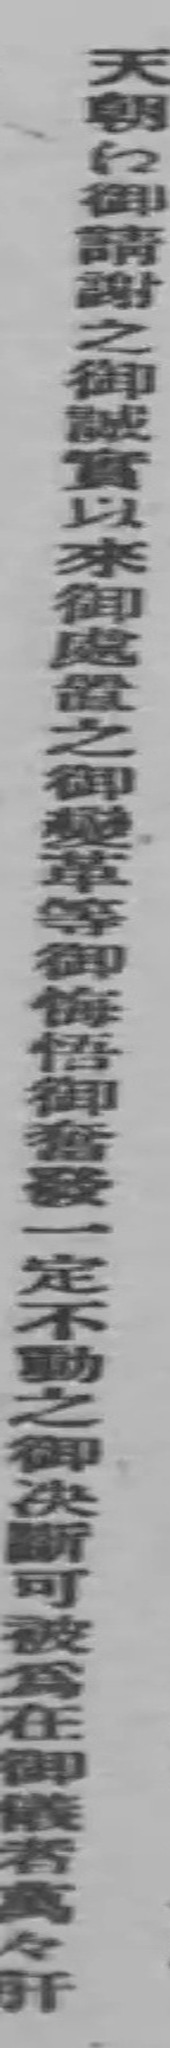天朝え御請謝之御誠実以来御処置之御変革等御悔悟御奮発一定不動之御決断可被為在御儀者万々肝
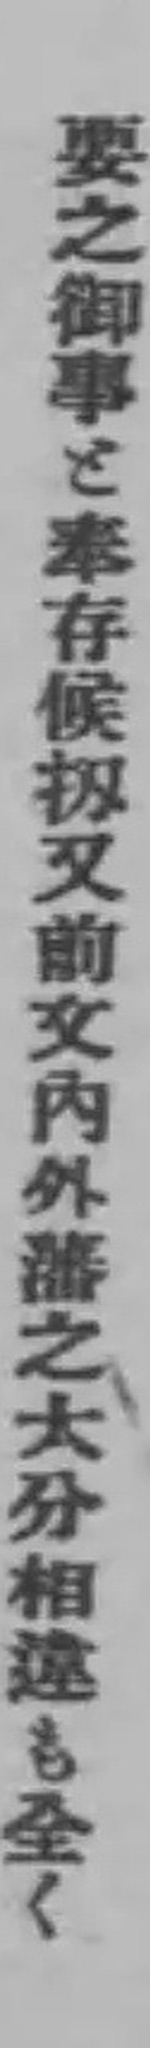要之御事と奉存候扨又前文内外藩之大分相違も全く
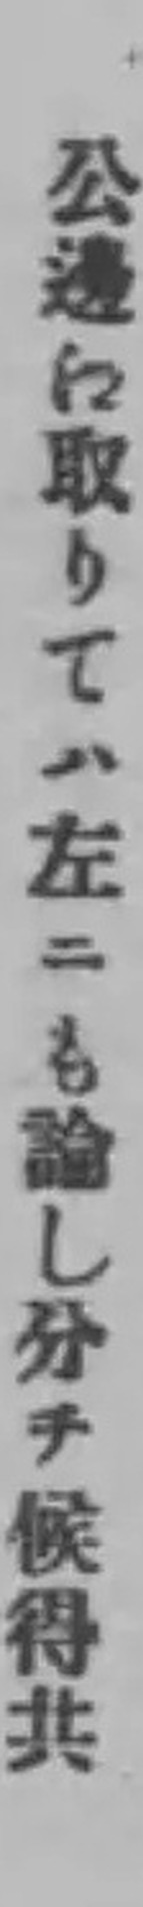公辺え取りては左ニも諭し分ち候得共
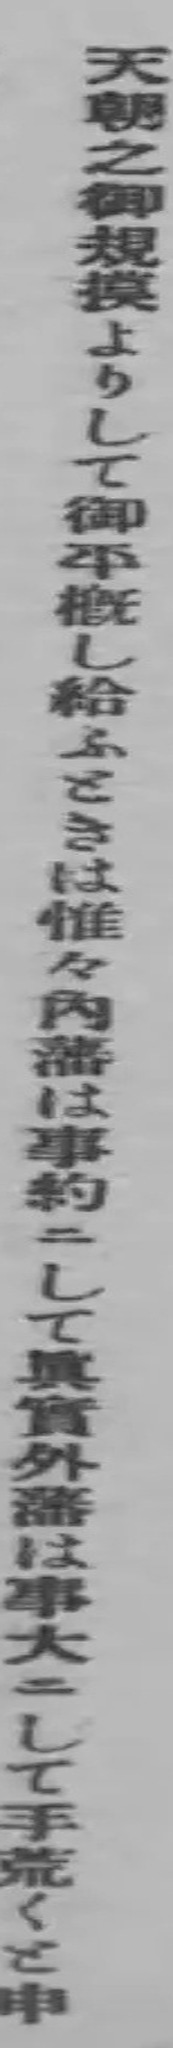天朝乃御規模よりして御平概し給ふときは惟々内藩は事約ニして真実外藩は事大ニして手荒くと申
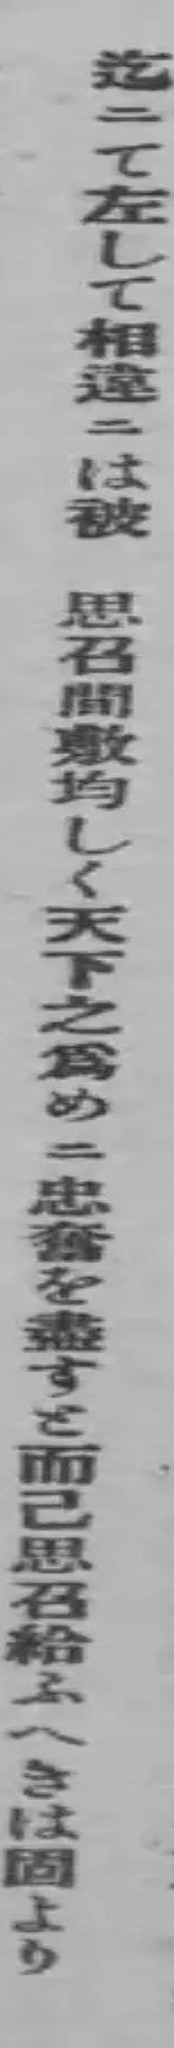迄ニて左して相違ニは被思召間敷均しく天下之為めニ忠奮を尽すと而己思召給ふへきは固より
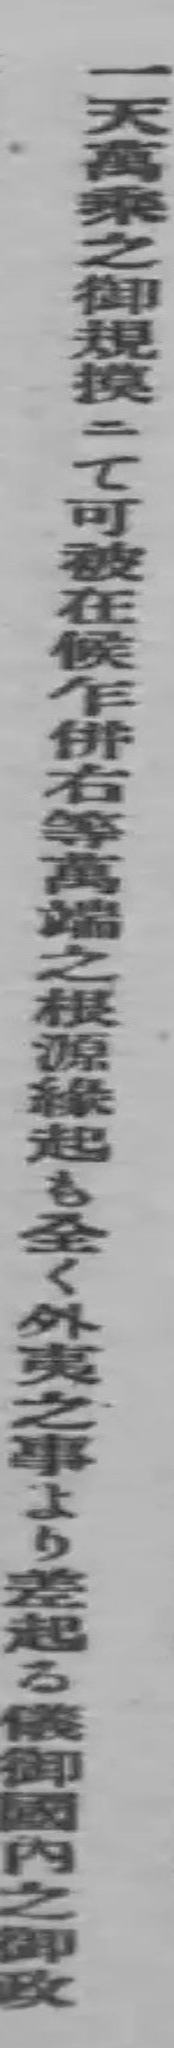一天万乗之御規模ニて可被在候乍併右等万端之根源縁起も全く外夷之事より差起る儀御国内之御政
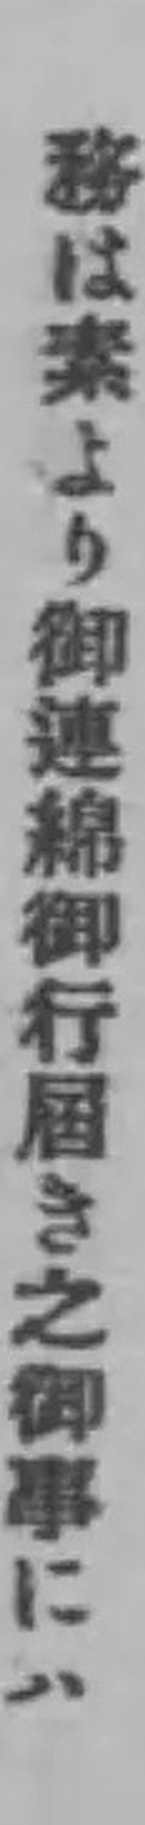務は素より御連綿御行届き之御事には
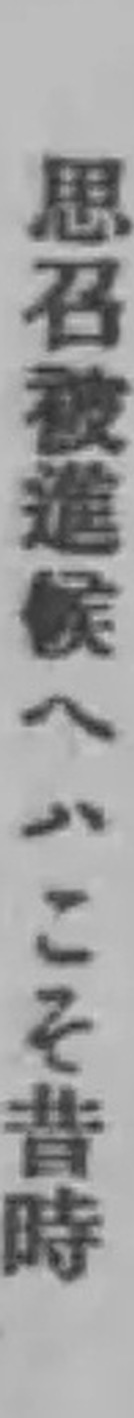思召被進候へはこそ昔時
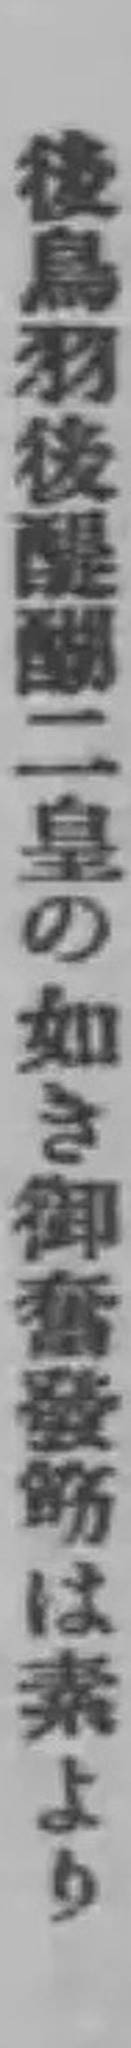後鳥羽後醍醐二皇の如き御奮発筋は素より
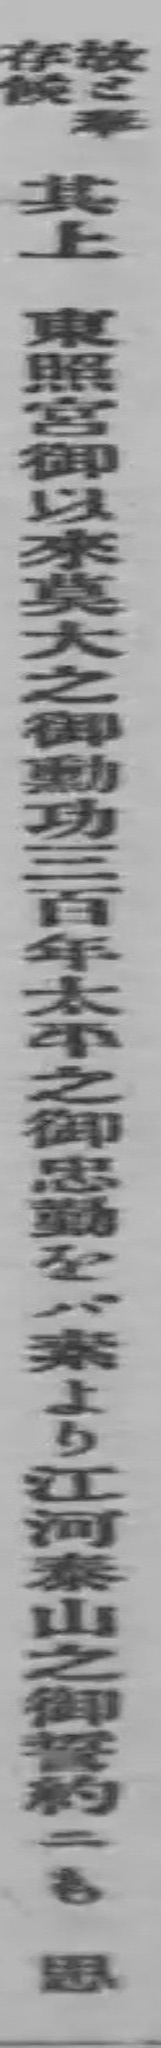故と奉存候其上東照宮御以来莫大之御勲功三百年太平之御忠勤をば素より江河泰山之御誓約ニも思
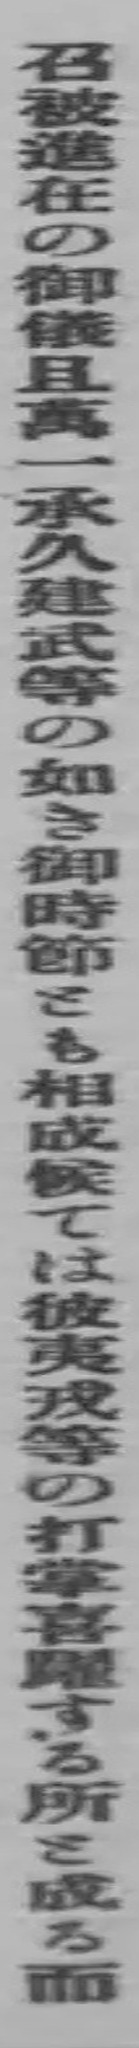召被進在の御儀且万一承久建武等の如き御時節とも相成候ては彼夷戎等の打掌喜躍する所と成る而
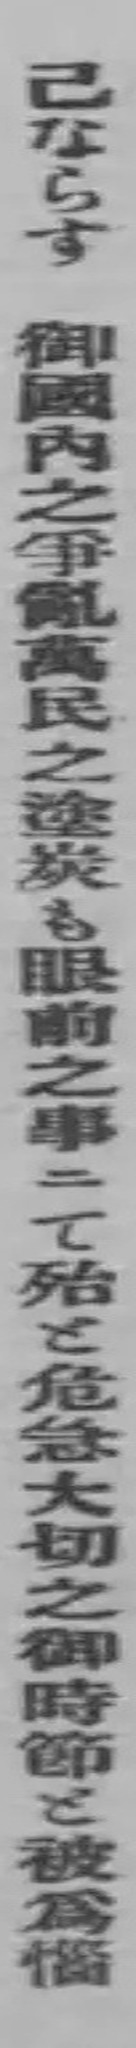己ならす御国内之争乱万民の塗炭も眼前之事ニて殆と危急大切之御時節と被為悩
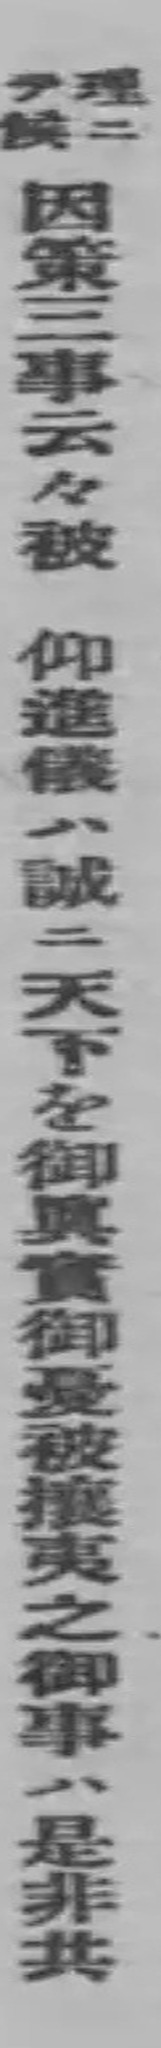理にて候因策三事云々被仰進儀は誠ニ天下を御真実御憂被攘夷之御事は是非共
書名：豊橋市史談
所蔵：国立国会図書館 National Diet Library, JAPAN
